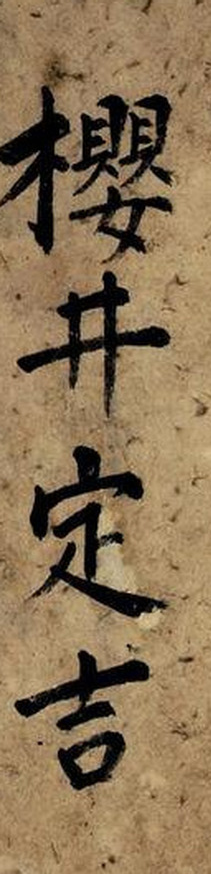桜井定吉
